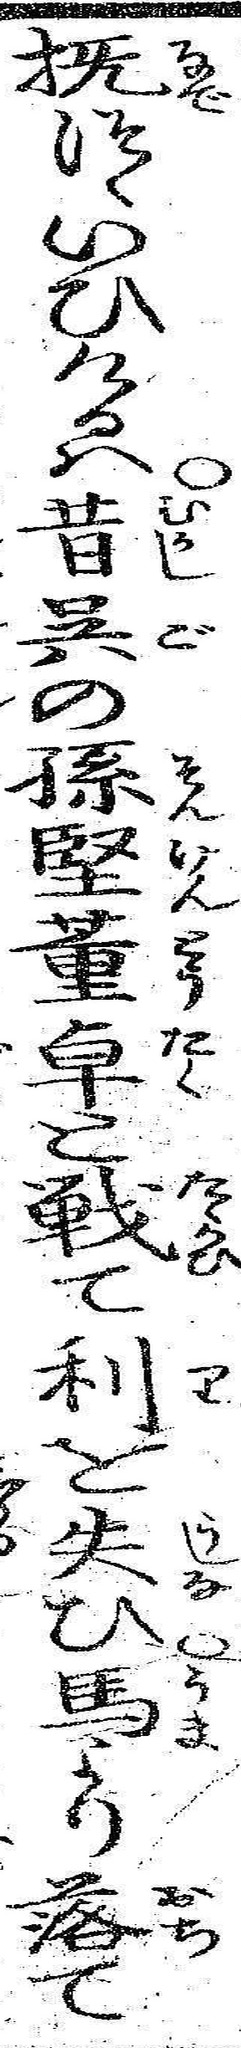抚つゝいひけるは。昔呉の孫堅董卓と戦て利を失ひ。馬より落て
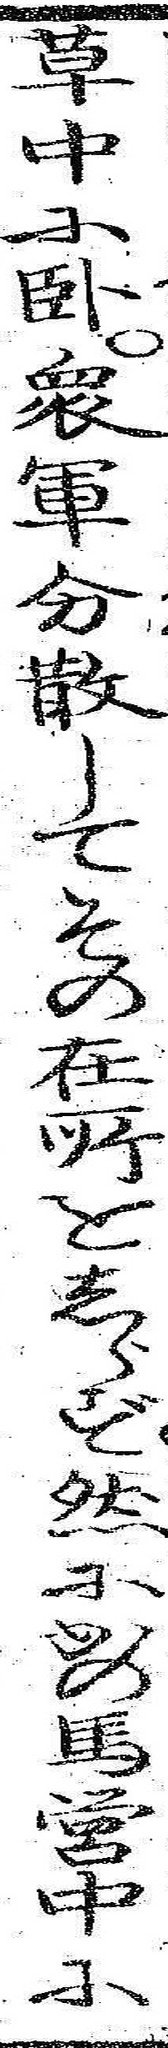草中に臥。衆軍分散してその在所をしらず。然にかの馬営中に

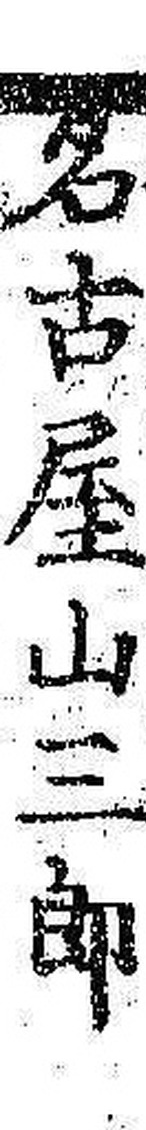名古屋山三郎
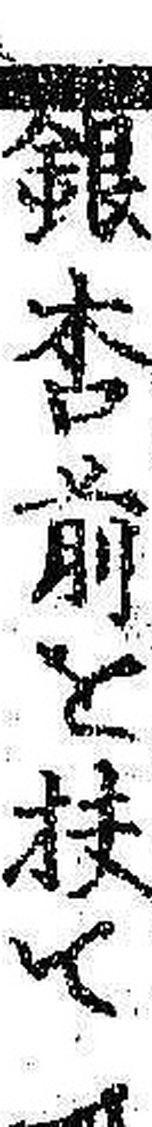銀杏前を扶て
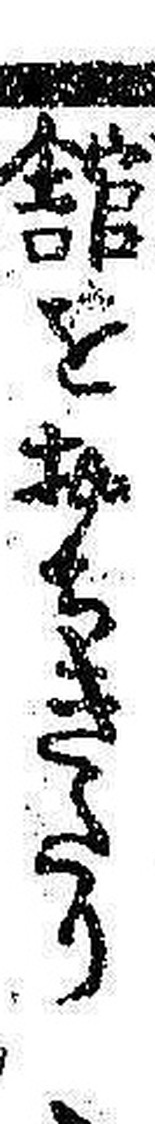館をおちきたり
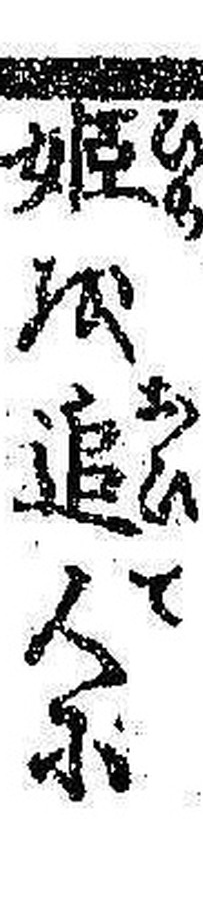姫を追人に
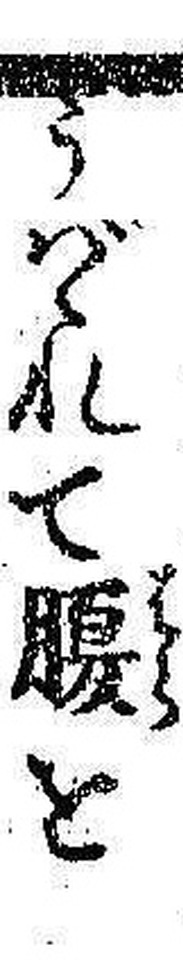うばゝれて腹を
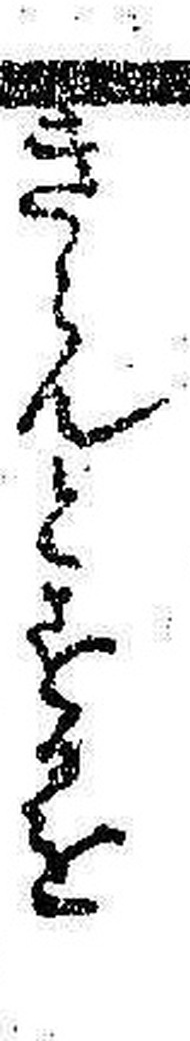きらんとするを
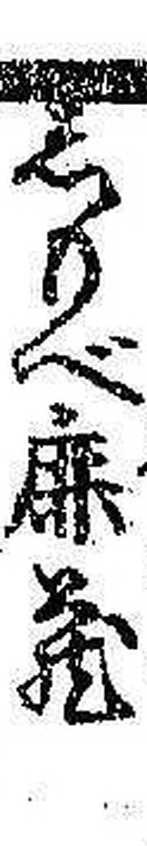しもべ鹿蔵
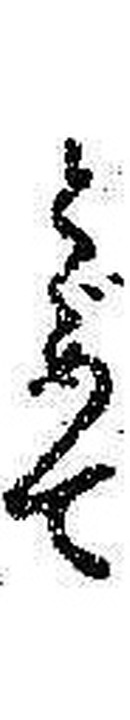とゞめて
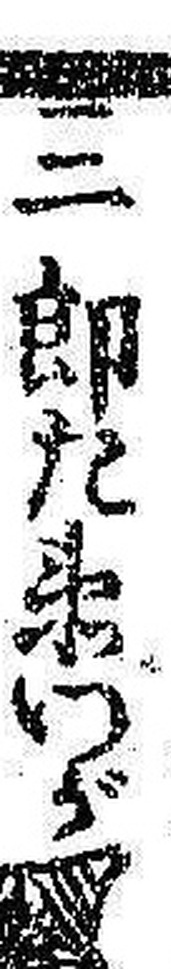三郎左衛門が
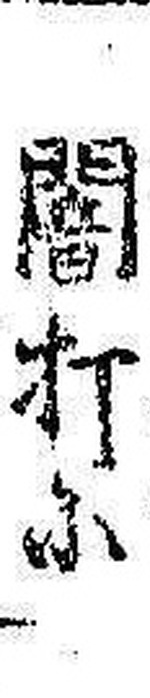闇打に
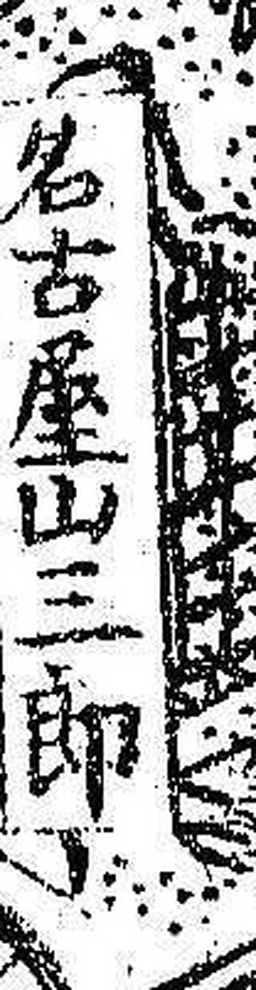名古屋山三郎
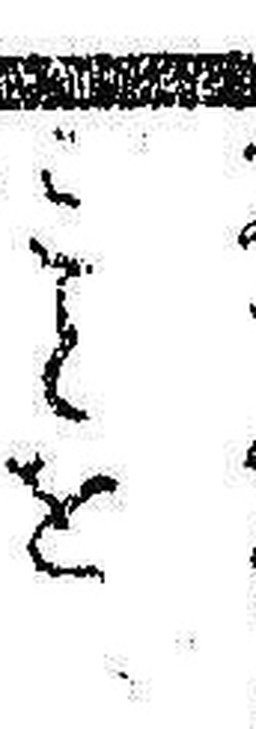ことを
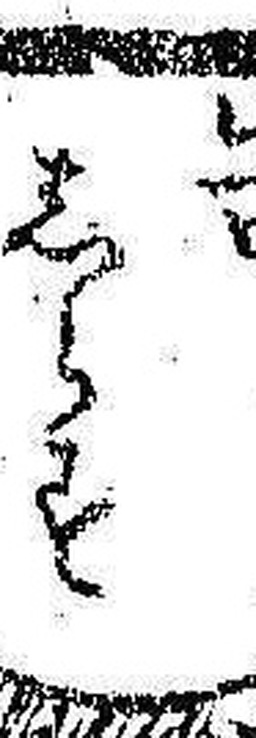しらす
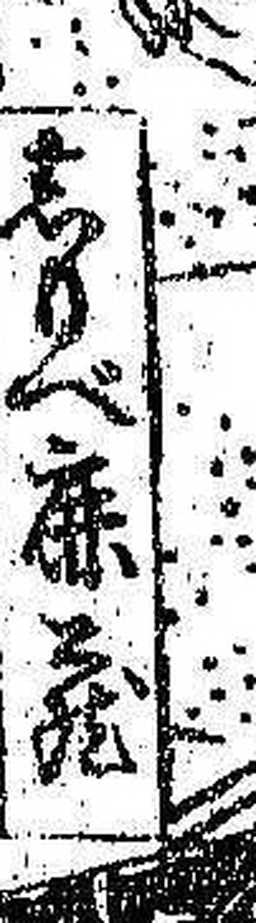しもべ鹿蔵
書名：昔話稲妻表紙
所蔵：国文学研究資料館
